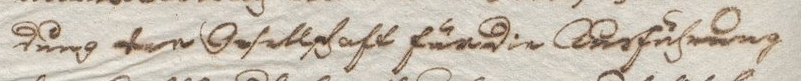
dung der Gesellschaft für die Ausführung
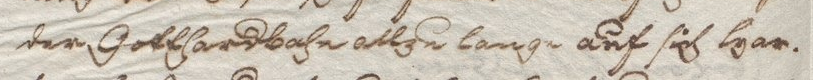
der Gotthardbahn allzu lange auf sich war-
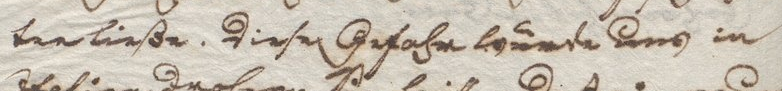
ten ließe. Diese Gefahr würde uns in
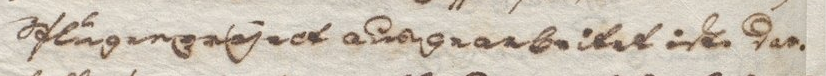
Splügenproject ausgearbeitet ist. Das-
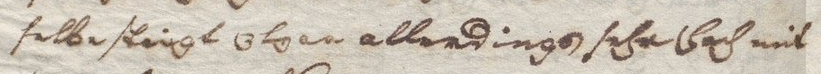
selbe steigt zwar allerdings sehr hoch mit
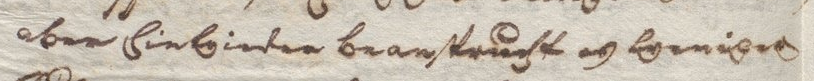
aber hinwieder beansprucht es weniger
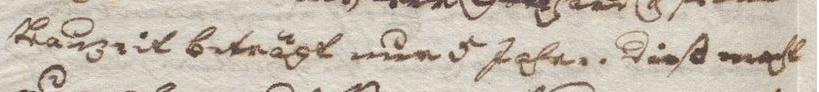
Bauzeit beträgt nur 5 Jahre. Dieß macht
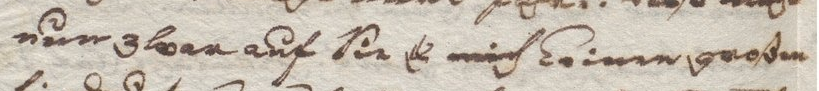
nun zwar auf Sie & mich keinen großen
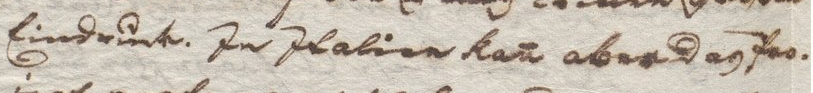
Eindruck. In Italien kann aber das Pro-
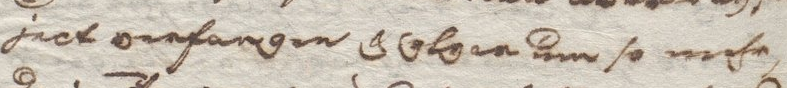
ject verfangen & zwar um so mehr,
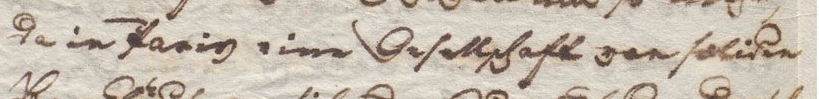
da in Paris eine Gesellschaft von soliden
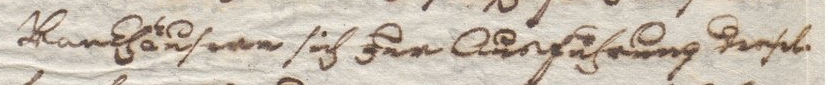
Bankhäusern sich zur Ausführung dersel-
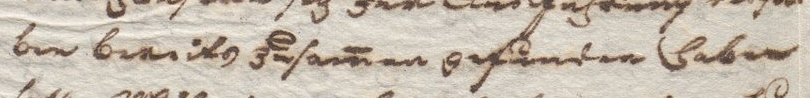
ben bereits zusammen gefunden haben
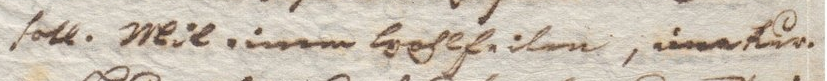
soll. Mit einem wohlfeilen, eine kur-
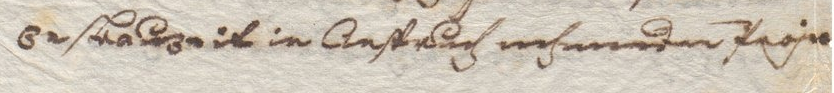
ze Bauzeit in Anspruch nehmenden Projec-
